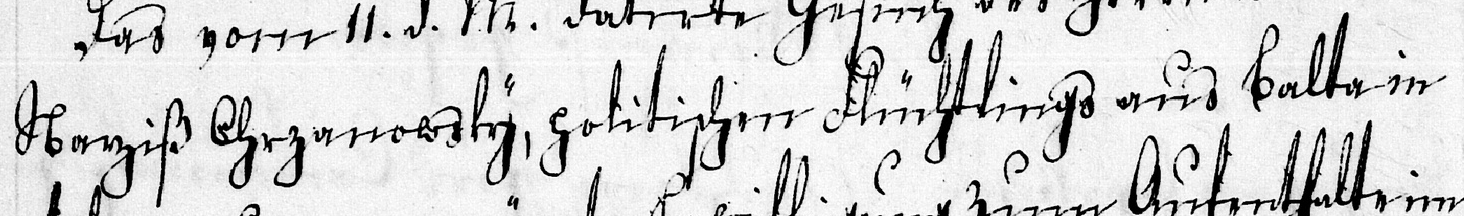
Narziß Chrzanowsky, politischen Flüchtlings aus Balta in
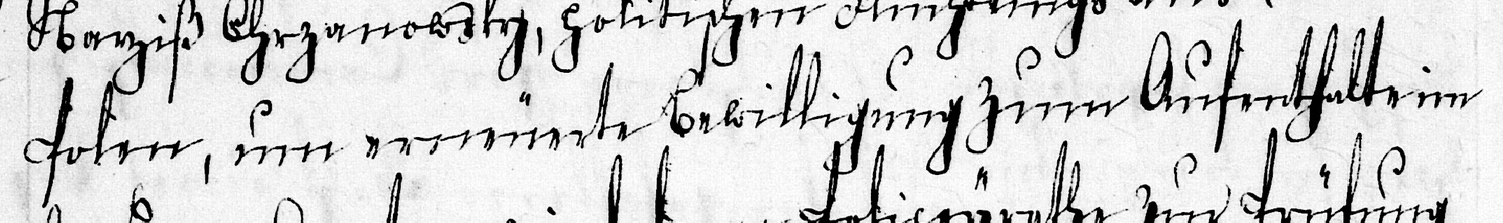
Polen, um erneuerte Bewilligung zum Aufenthalte im
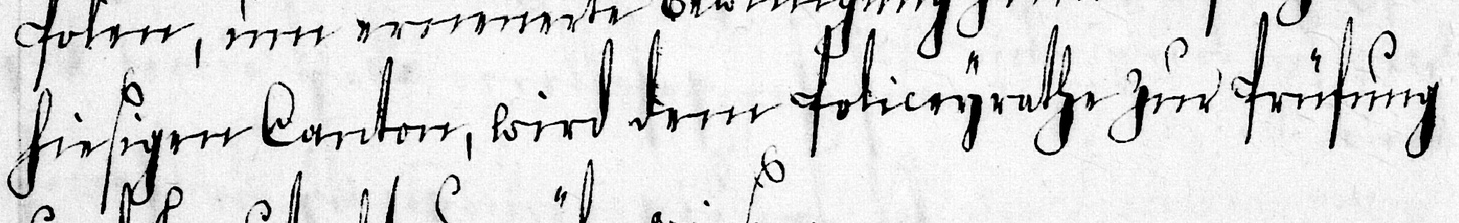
hiesigen Canton, wird dem Policeyrathe zur Prüfung
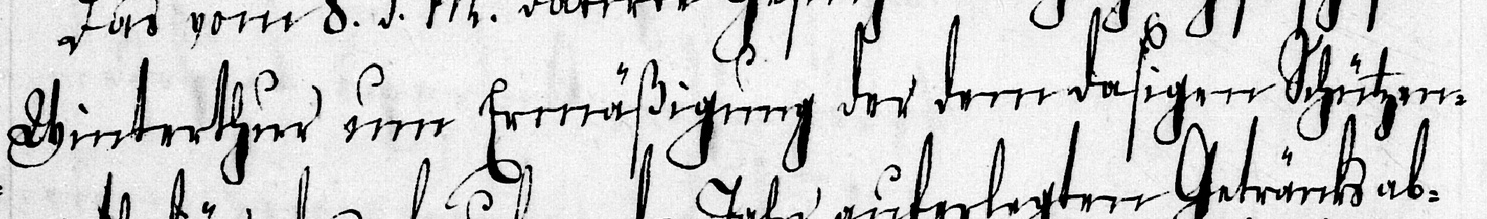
Winterthur um Ermäßigung der dem dasigen Schützen¬
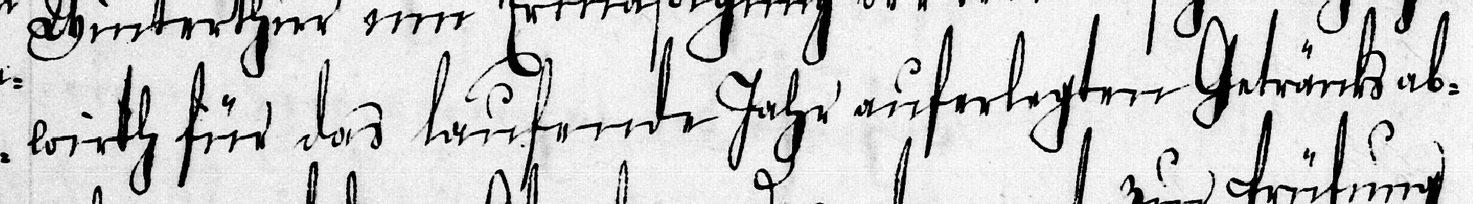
wirth für das laufende Jahr auferlegten Getränksab¬
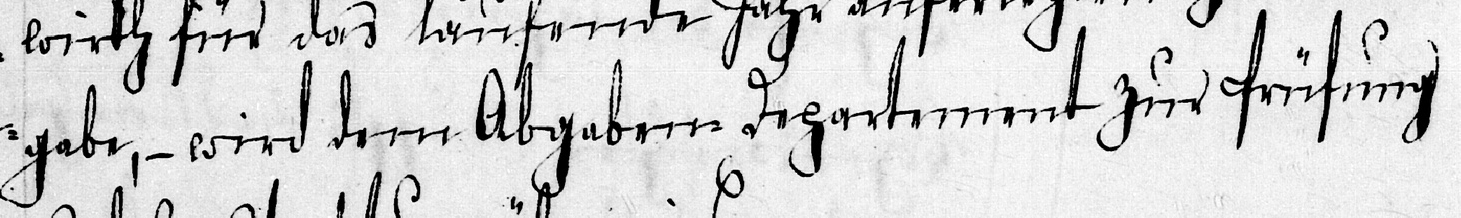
gabe, – wird dem Abgaben-Departement zur Prüfung
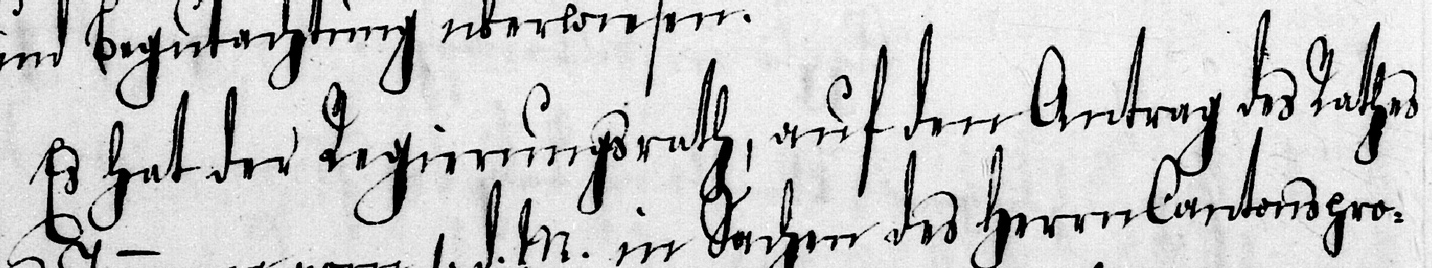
Es hat der Regierungsrath, auf den Antrag des Rath¬
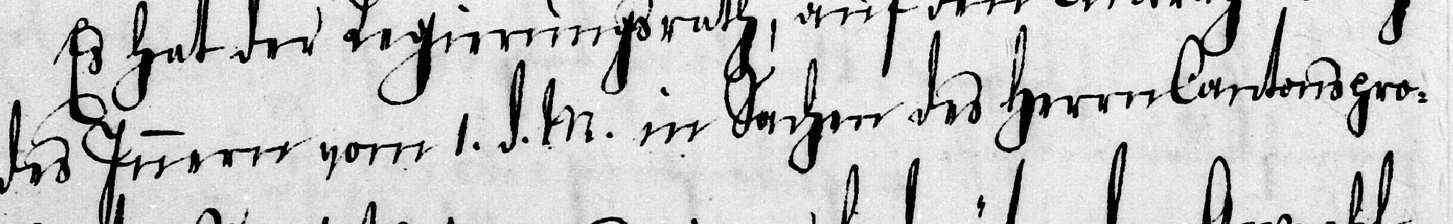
des Innern vom 1. d. M. in Sachen des Herrn Cantonspro¬
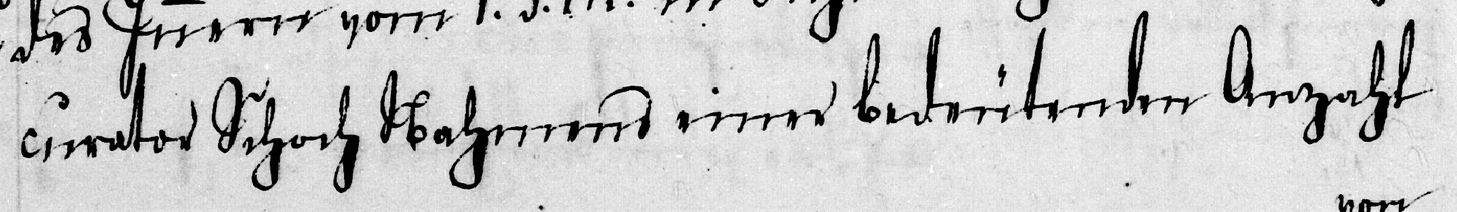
curator Schoch Nahmens einer bedeutenden Anzahl
